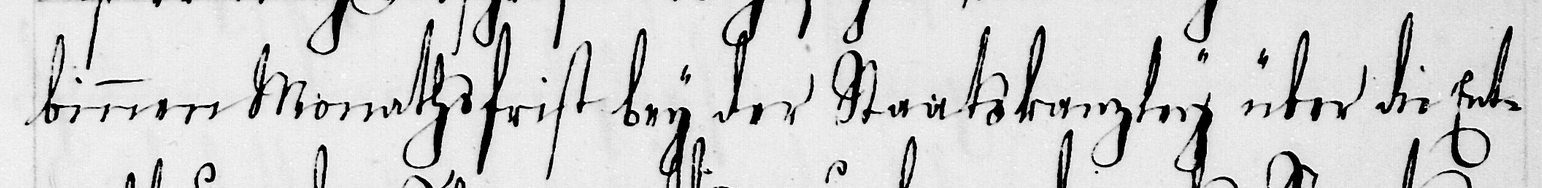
binnen Monathsfrist bey der Staatskanzley über die Ent¬
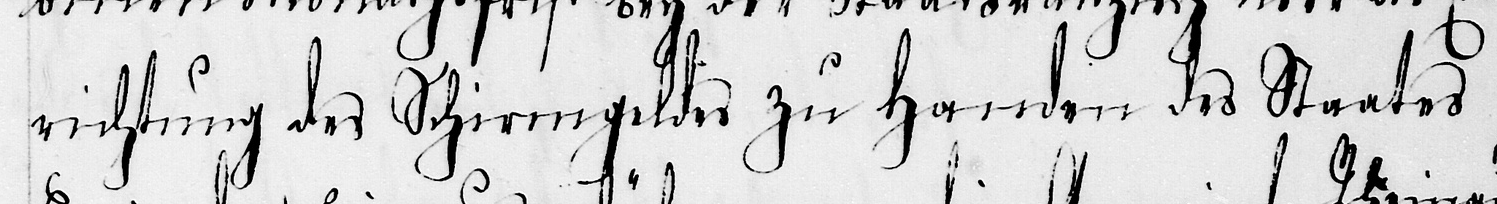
richtung des Schirmgeldes zu Handen des Staates
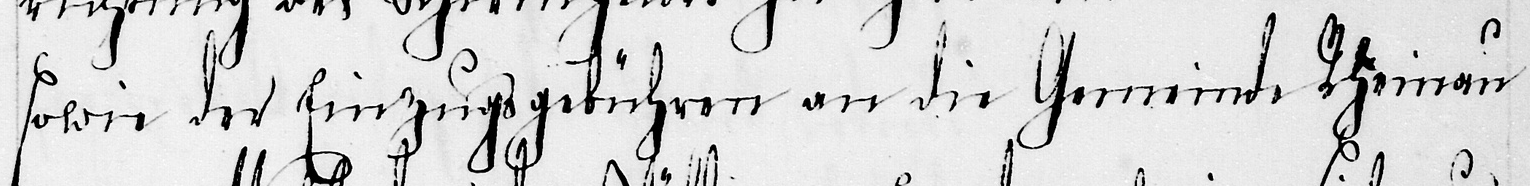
sowie der Einzugsgebühren an die Gemeinde Rheinau
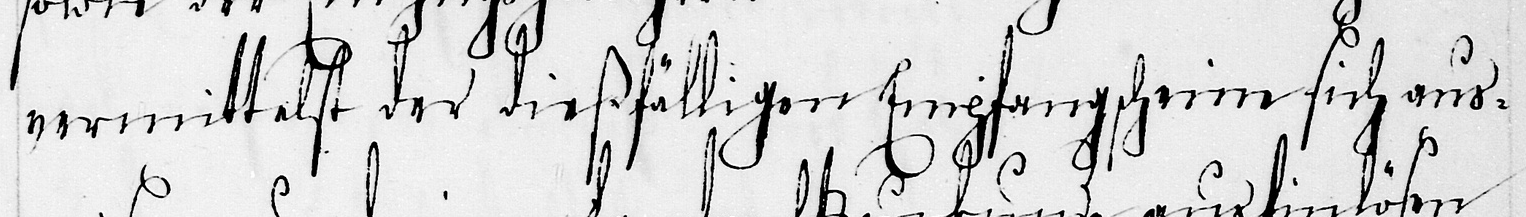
vermittelst der dießfälligen Empfangscheine sich aus¬
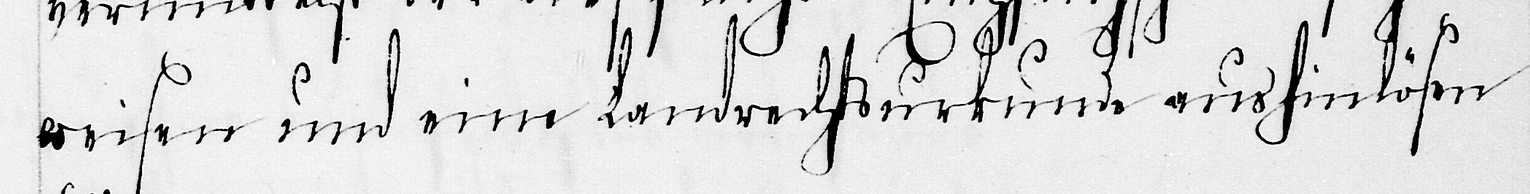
weisen und eine Landrechtsurkunde aushinlösen
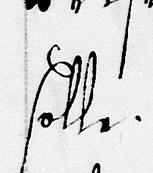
le.
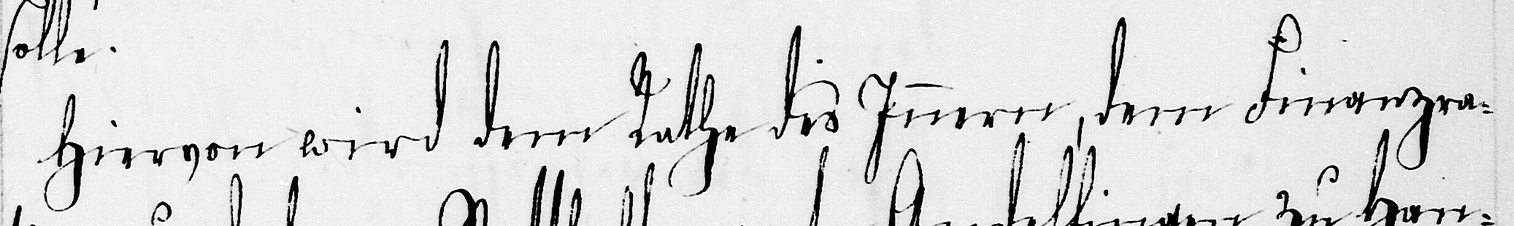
Hiervon wird dem Rathe des Innern, dem Finanzra¬
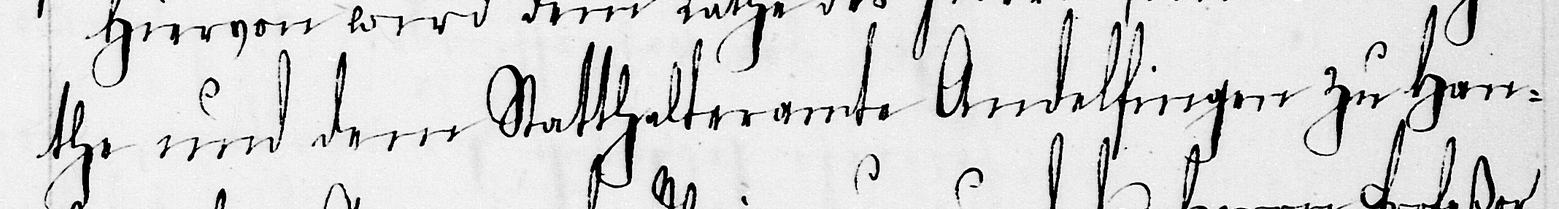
the und dem Statthalteramte Andelfingen zu Han¬
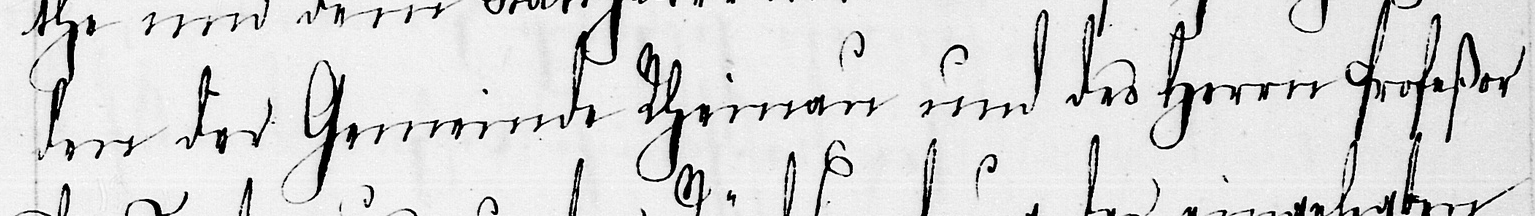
den der Gemeinde Rheinau und des Herrn Profeßor
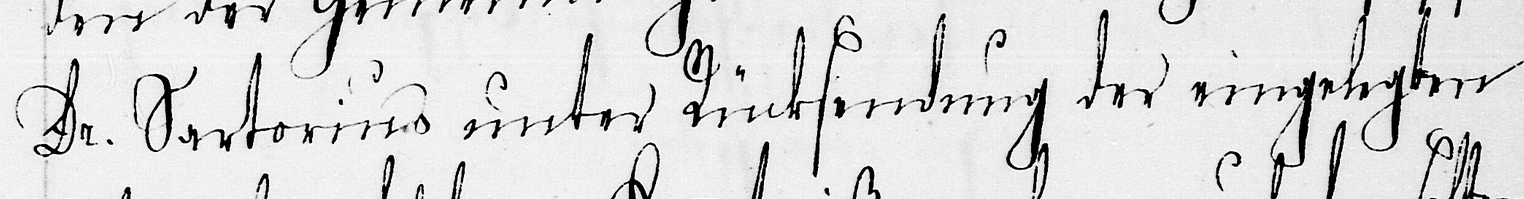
Dr. Sartorius unter Rücksendung der eingelegten
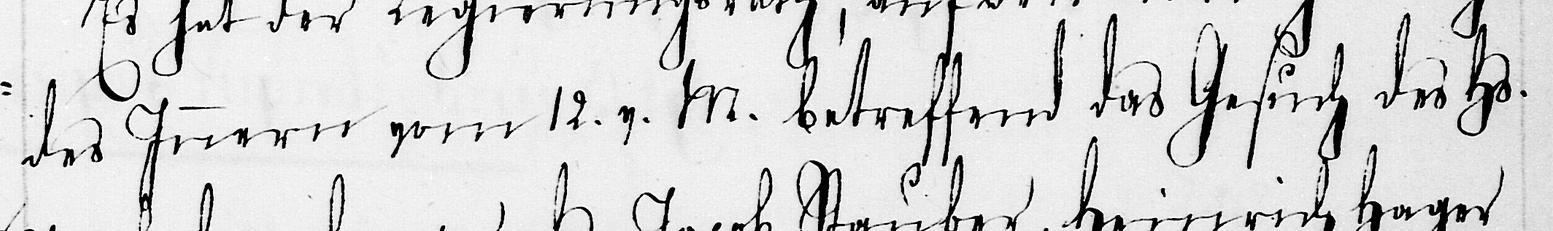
des Innern vom 12. v. M. betreffend das Gesuch des Hs.
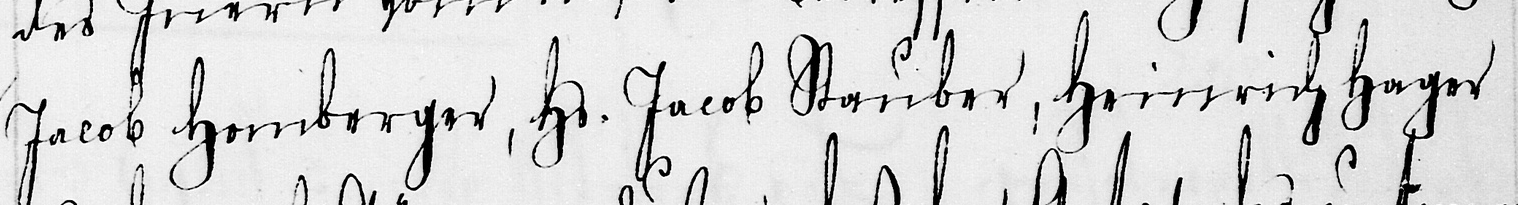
Jacob Homberger, Hs. Jacob Stauber, Heinrich Hager
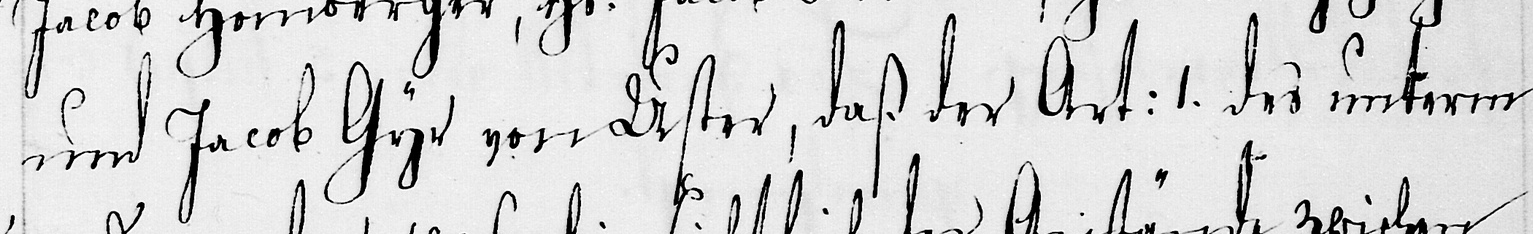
und Jacob Gyr von Uster, daß der Art: 1. des unterm
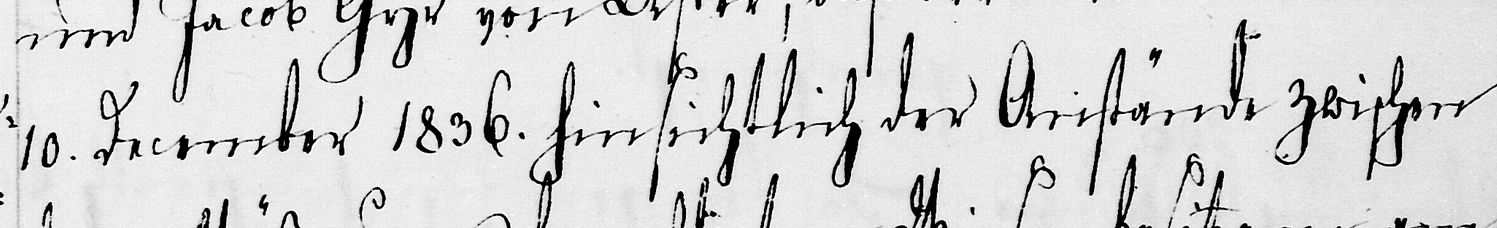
1. December 1836. hinsichtlich der Anstände zwischen
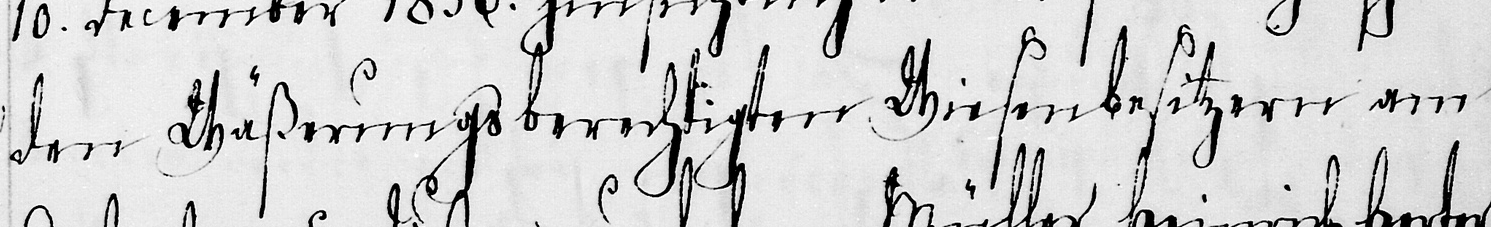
den Wäßerungsberechtigten Wiesenbesitzern am
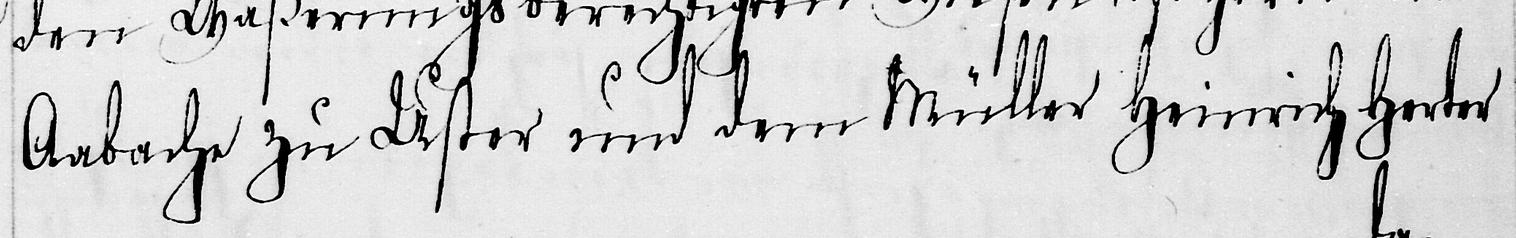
Aabache zu Uster und dem Müller Heinrich Herter
